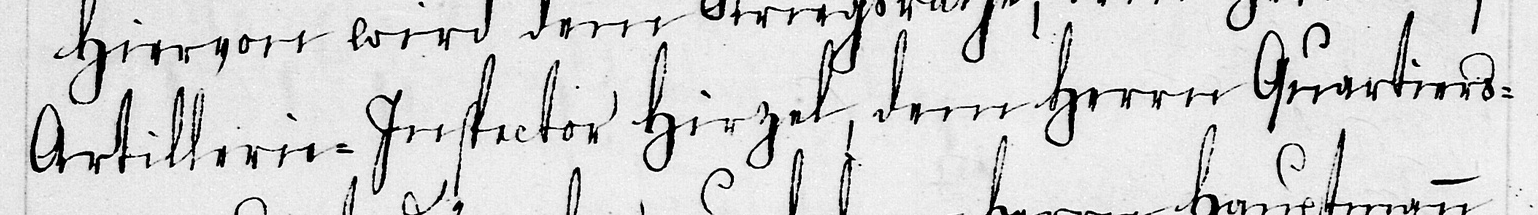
Artillerie-Inspector Hirzel, dem Herrn Quartiers¬
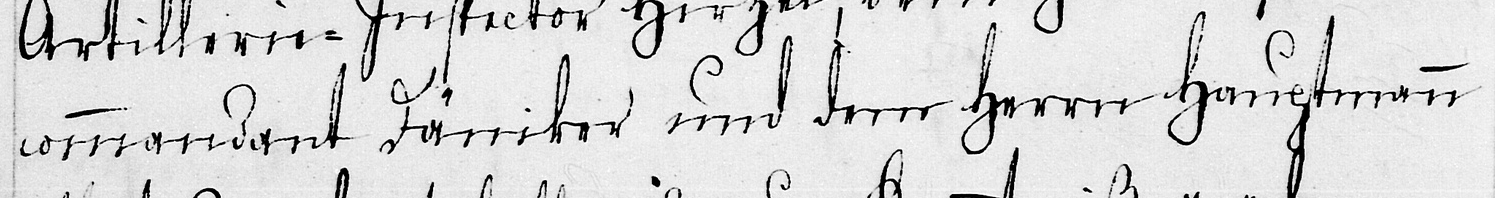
commandant Däniker und dem Herrn Hauptmann
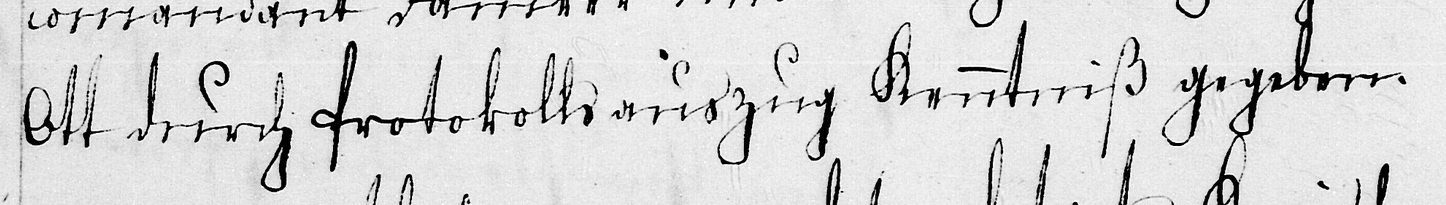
Ott durch Protokollsauszug Kenntniß gegeben.
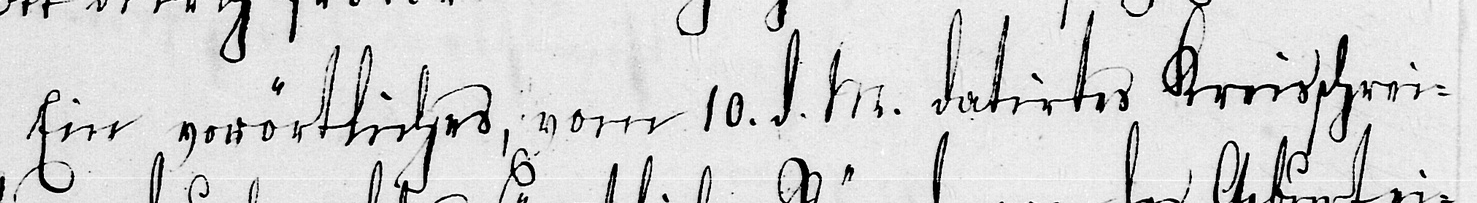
Ein vorörtliches, vom 10. d. M. datirtes Kreisschrei¬
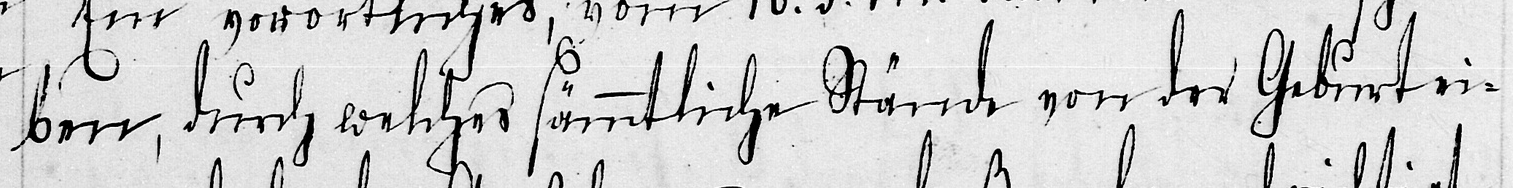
ben, durch welches sämmtliche Stände von der Geburt ei¬
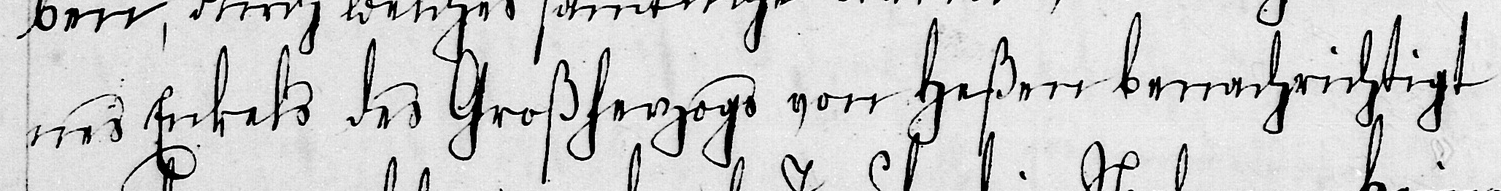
nes Enkels des Großherzogs von Heßen benachrichtigt
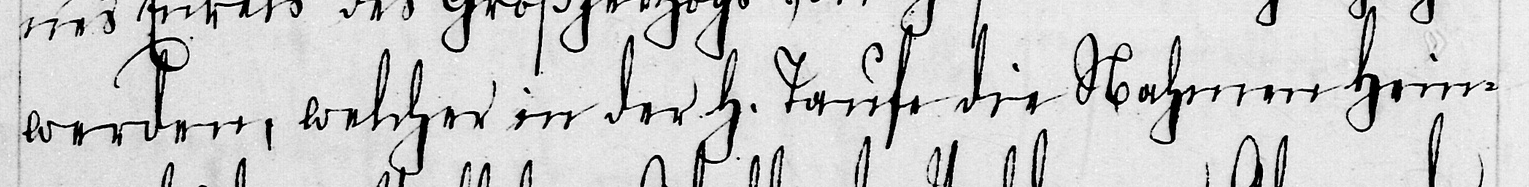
werden, welcher in der H. Taufe die Nahmen Hein¬
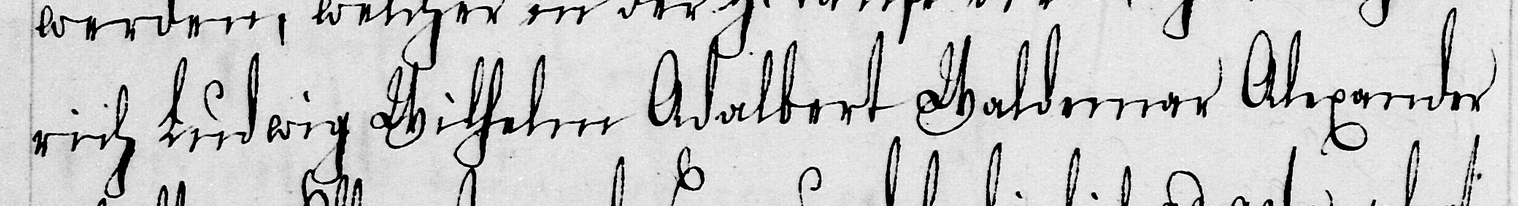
rich Ludwig Wilhelm Adalbert Waldemar Alexander
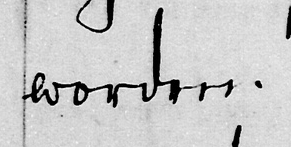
worden.
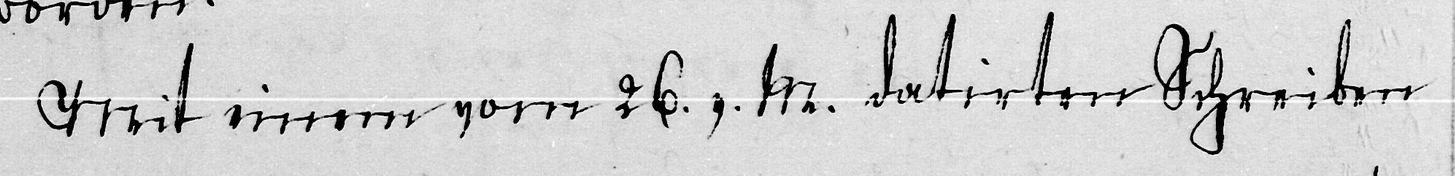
Mit einem vom 26. v. M. datirten Schreiben
